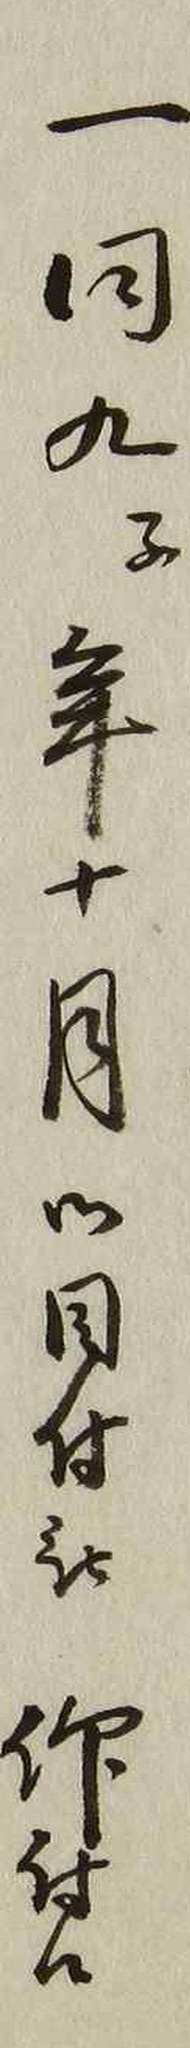一同九子年十月御目付被仰付候
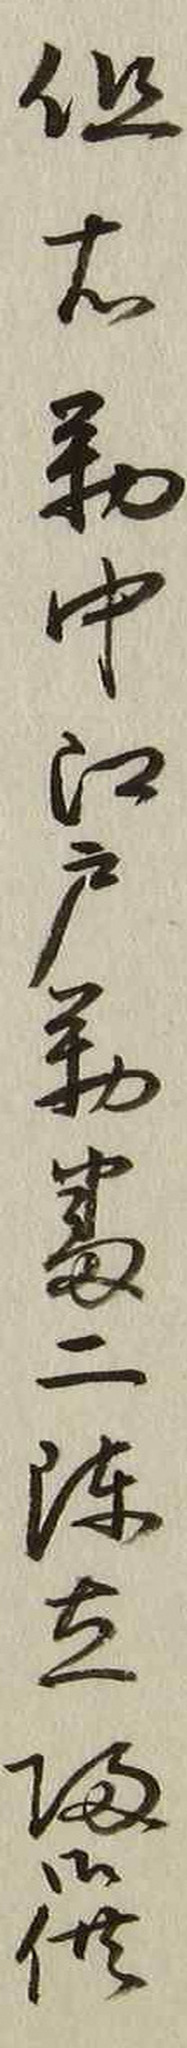但右勤中江戸勤番二陳立帰御供
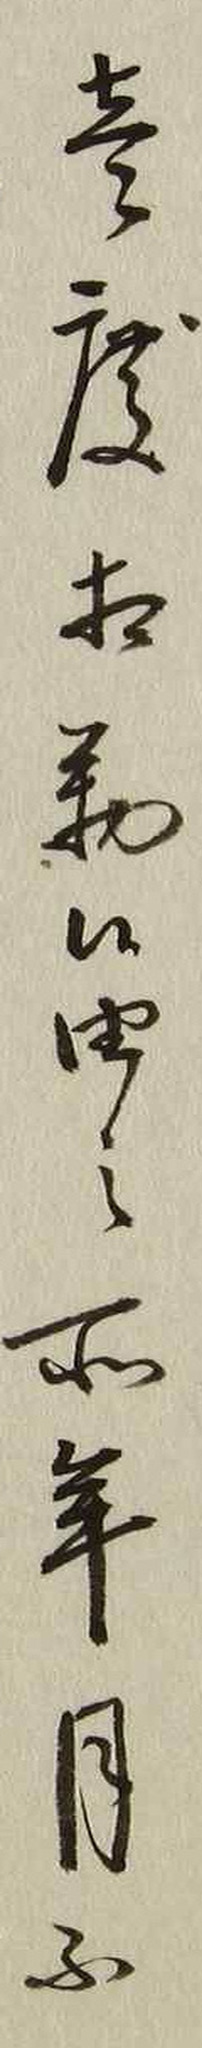壱度相勤候由之所年月不
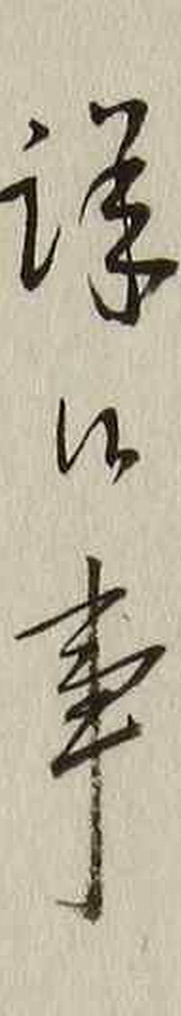詳候事
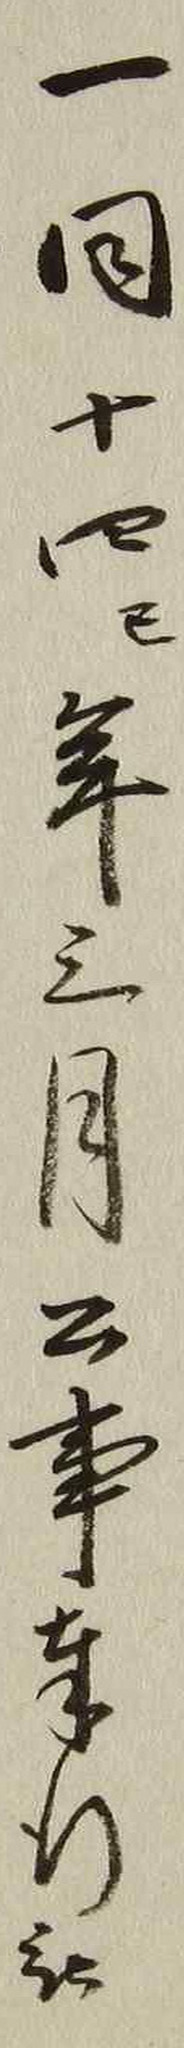一同十四巳年三月公事奉行被
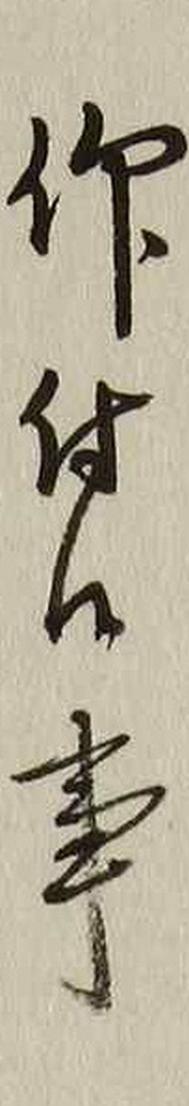仰付候事
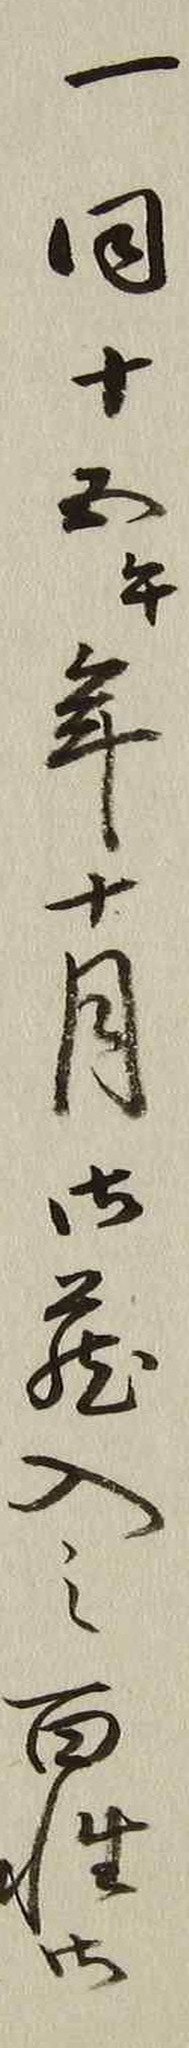一同十五午年十月御蔵入之百性御
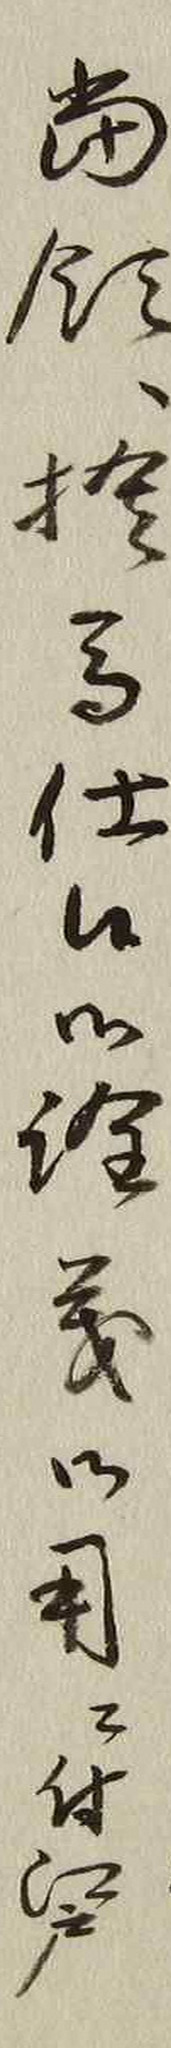当領へ捨馬仕候御詮義御用ニ付江戸
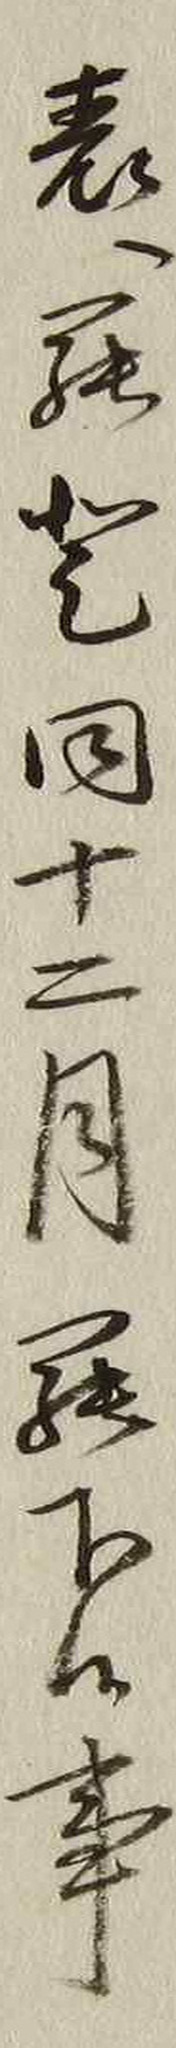表へ罷登同十二月罷下候事
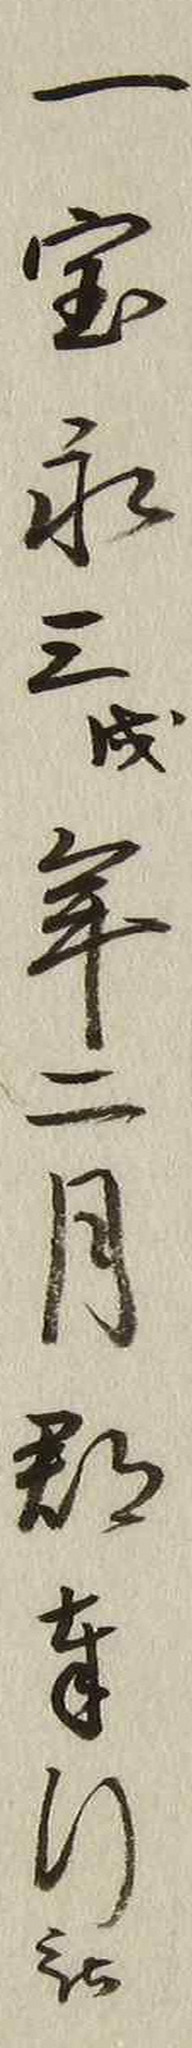一宝永三戌年二月郡奉行被
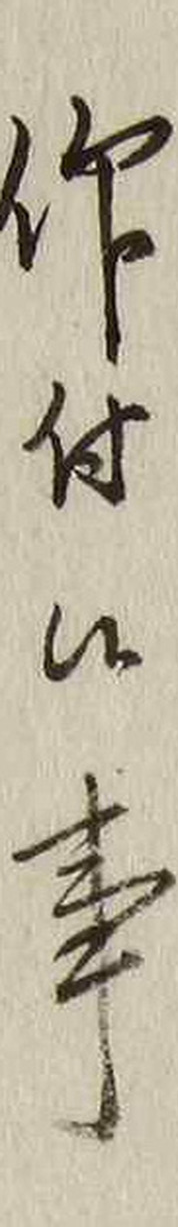仰付候事
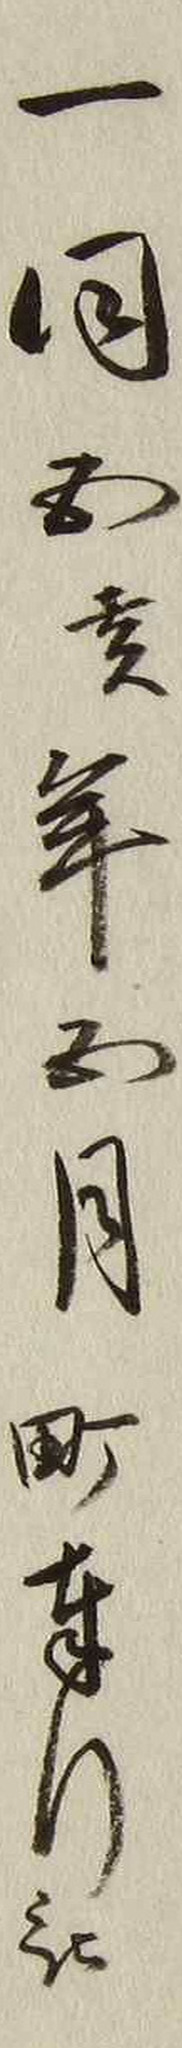一同五亥年五月町奉行被
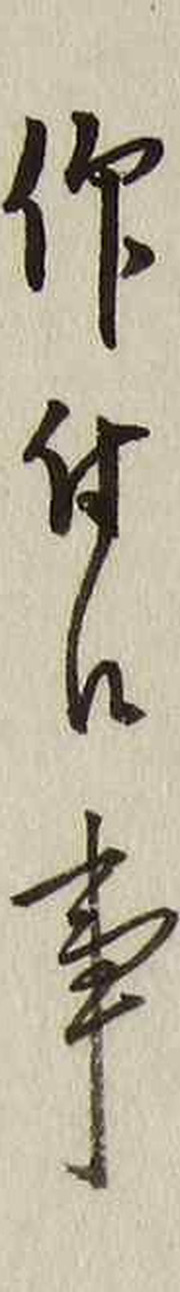仰付候事
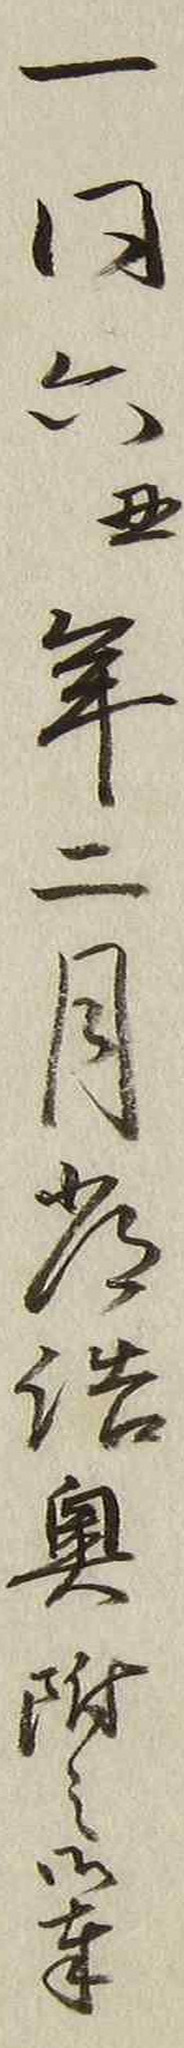一同六丑年二月常詰奥附之御奉
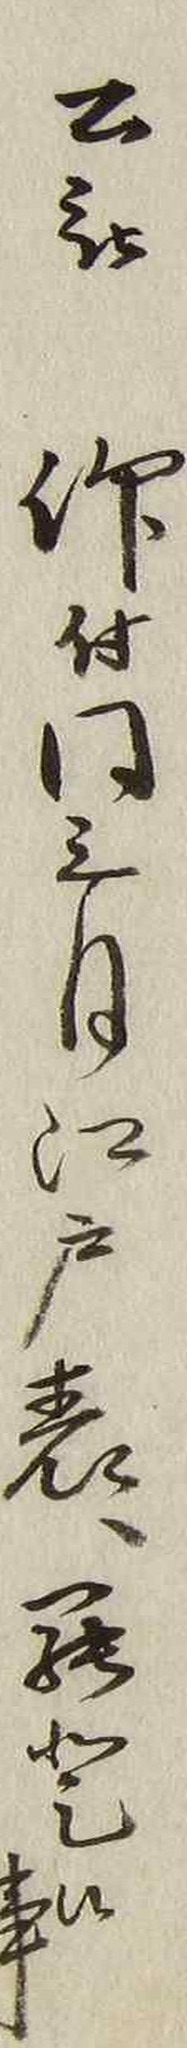公被仰付同三月江戸表へ罷登候事
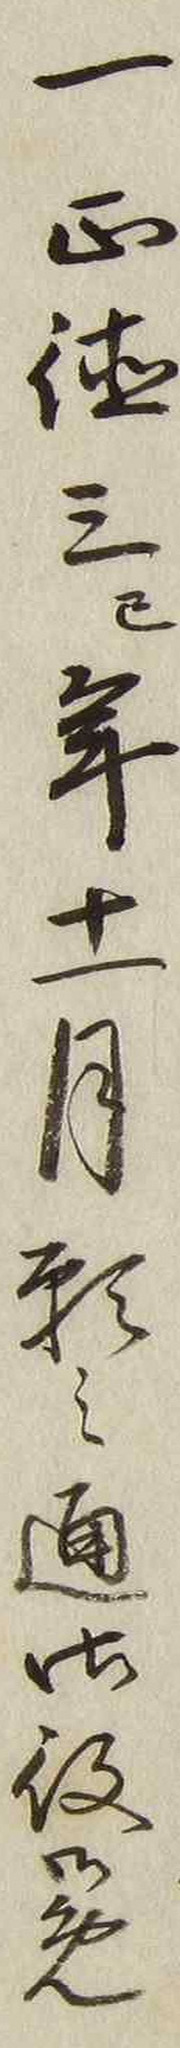一正徳三巳年十一月願之通御役御免
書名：諸士系譜　巻之149　そ之部2
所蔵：会津若松市立会津図書館
